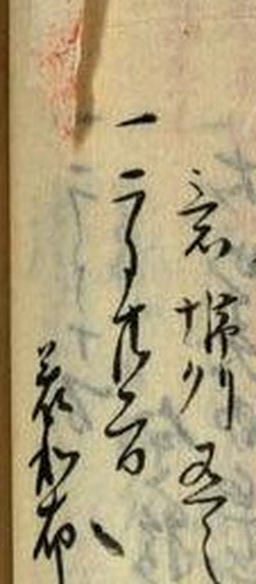一二月廿二日
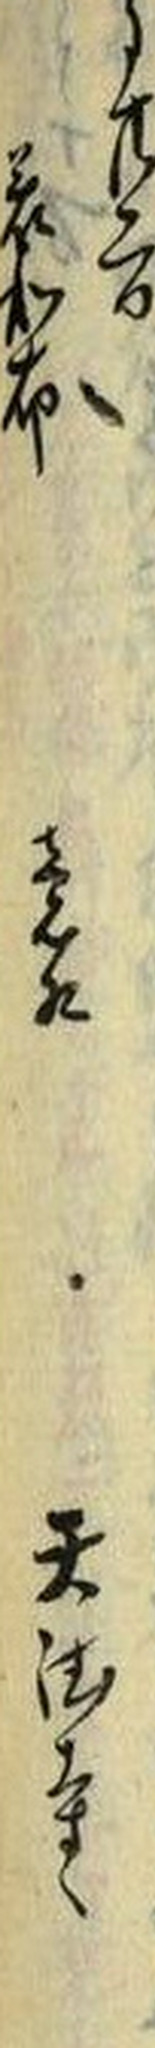若和布壱箱天徳寺へ
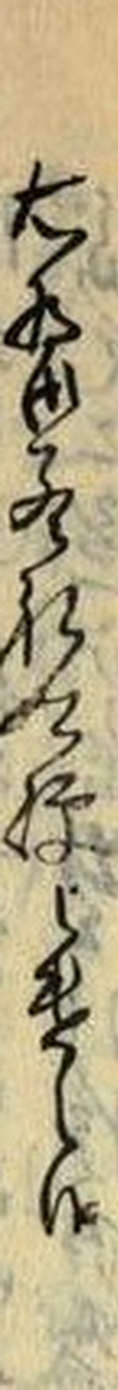右為御答礼今便被遣之候
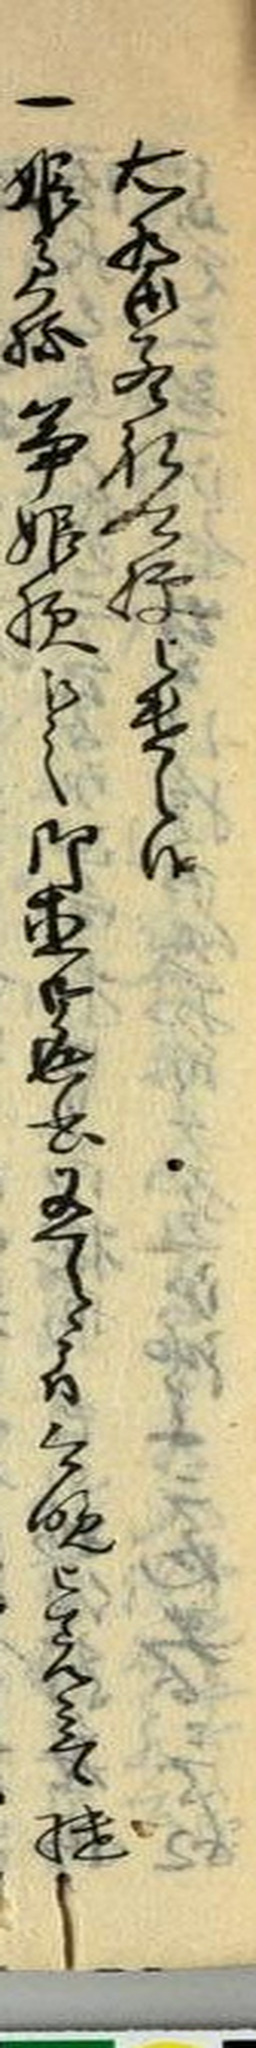一姫君様箏姫様江之御直御返書有之候ニ付今晩被差立候継
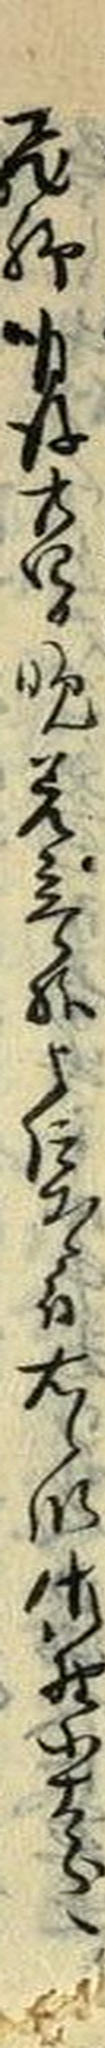飛脚明後廿四日晩差立候様被仰出候ニ付右之段佐野小太郎へ
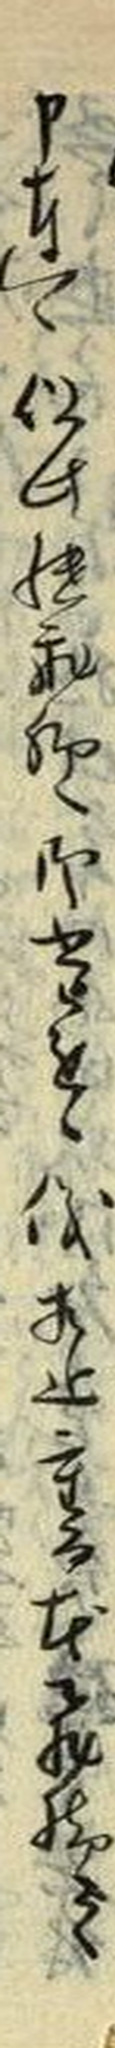申達候但此継飛脚へ御書被進候儀相止重而本飛脚之
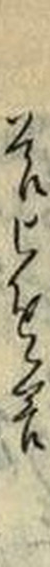節被進候筈
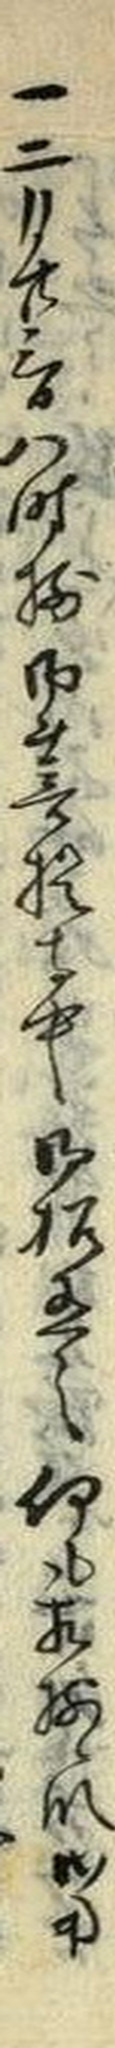一二月廿三日八時揃御菩提寺中御招有之何も相揃候段御用
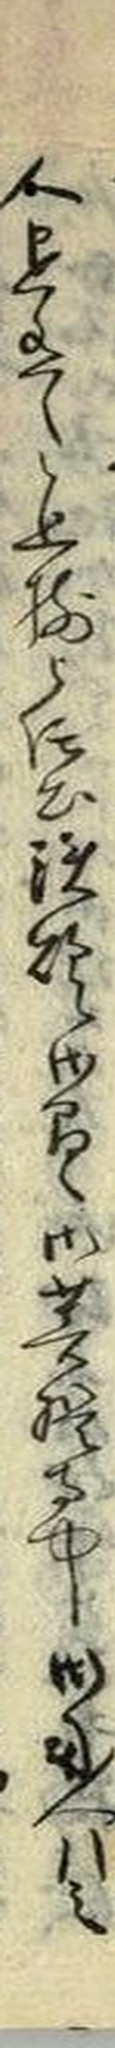人申上有之候上揃被仰出鉄炮之御間へ御菩提寺中御用人引之
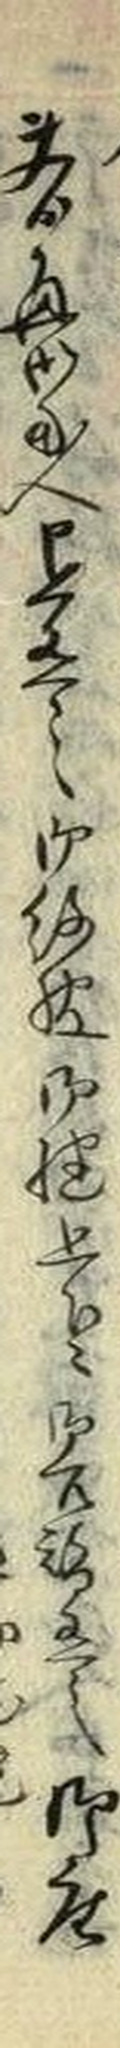夫ゟ再御用人申上有之御紋服御継上下ニ御召替有之御座
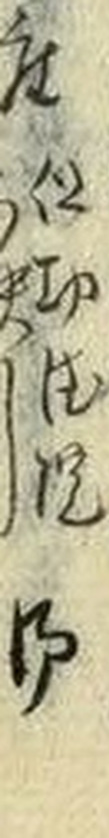不快引御
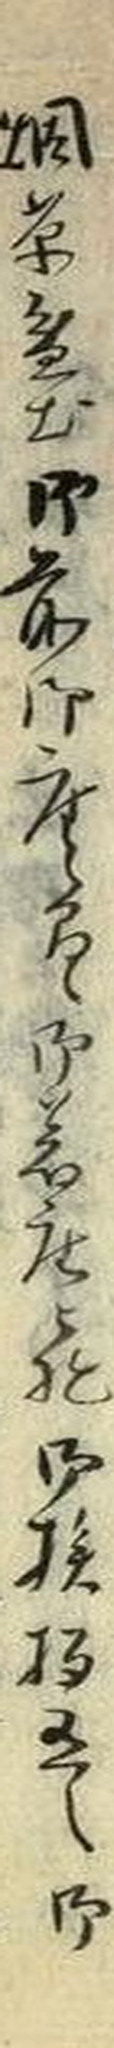煙草盆出御前御座之間へ御着座被遊御挨拶有之御
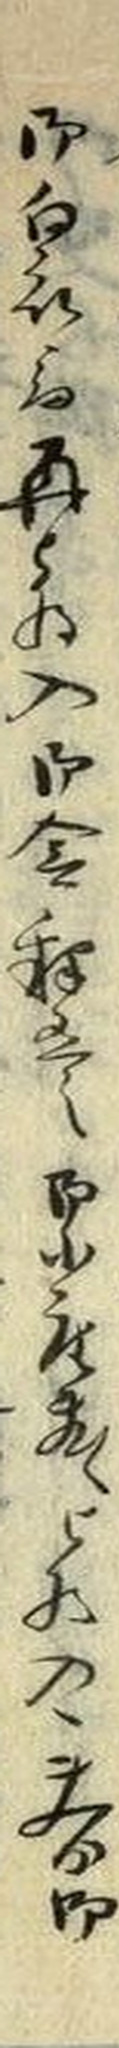御白衣ニ而再被為入御会釈有之御小座敷へ被為入候夫ゟ御
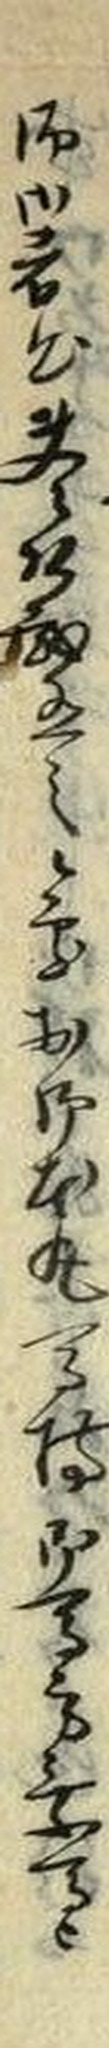酒御肴出夫々頂戴有之候処於御本丸馬場御馬方乗馬被
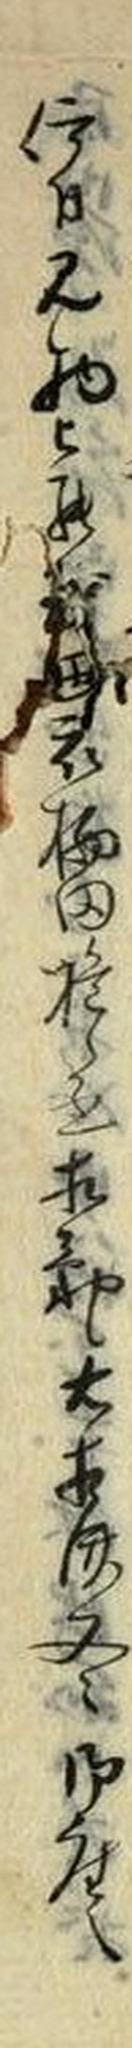仰付見物被罷衣柄田権之丞相勤候右相済又々御座之

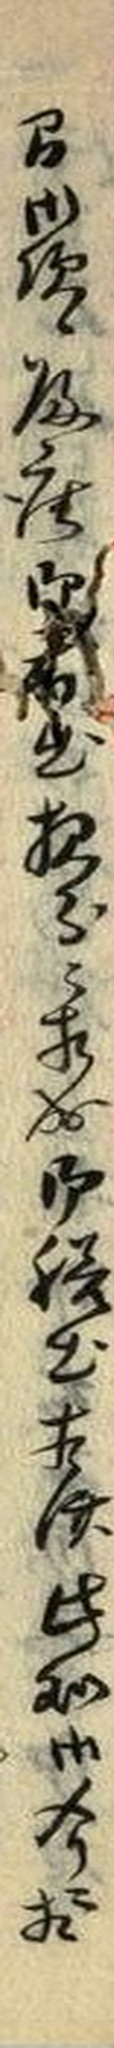間御次へ帰座御出夜分ニ相成御膳出相済此処御入りニ相
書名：少傅日録抄（斉承付側向頭取日記、在国）
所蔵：福井県文書館 Fukui Prefectural Archives
